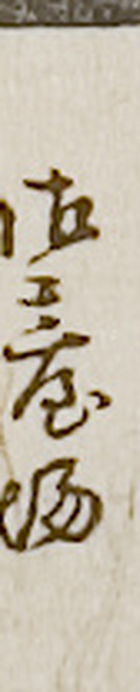御台場
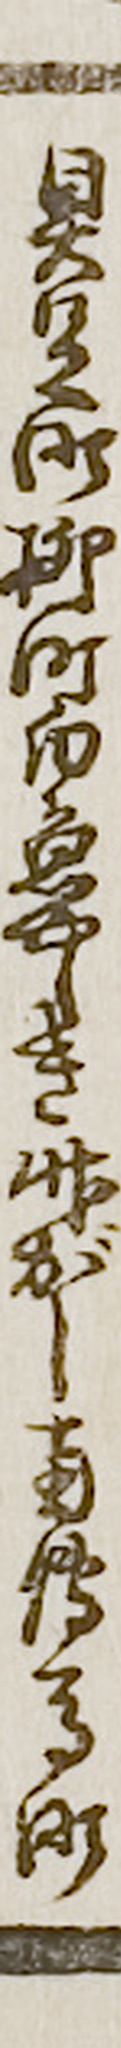具足町柳町白魚やしき竹がし南伝馬町
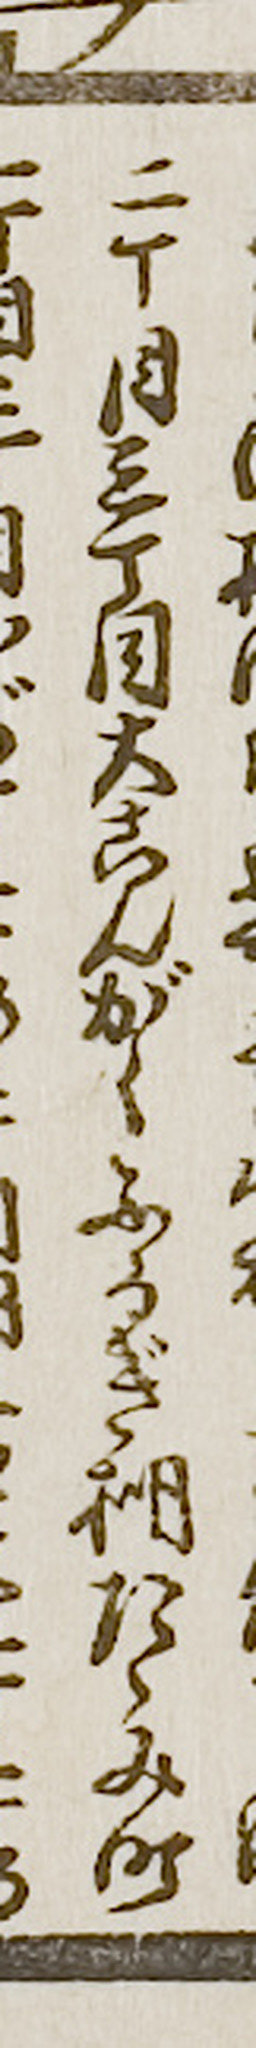一丁目二丁目かぢ丁一丁め二丁目同三四大工丁一丁め
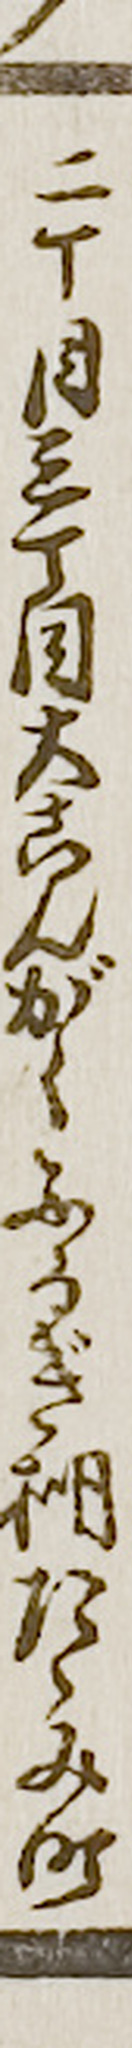二丁目三丁目大こんがしふるぎ棚たゝみ町
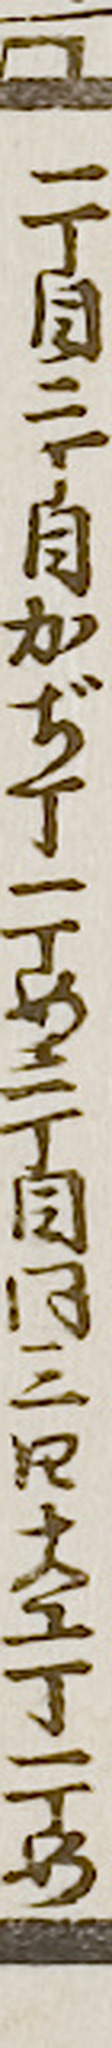一丁目二丁目かぢ丁一丁め二丁目同三四大工丁一丁め
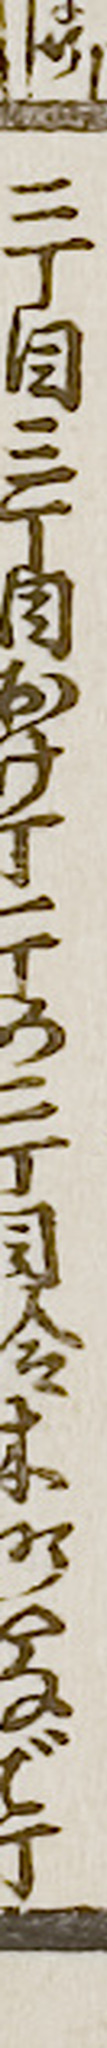二丁目三丁目おけ丁一丁め二丁目鈴木町いなば丁
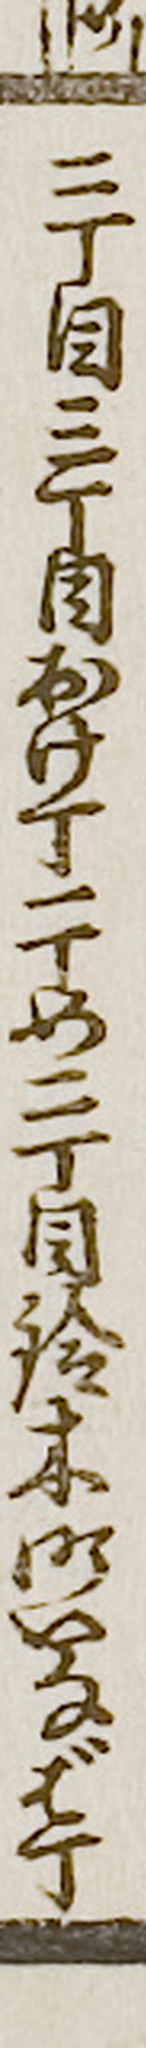二丁目三丁目おけ丁一丁め二丁目鈴木町いなば丁
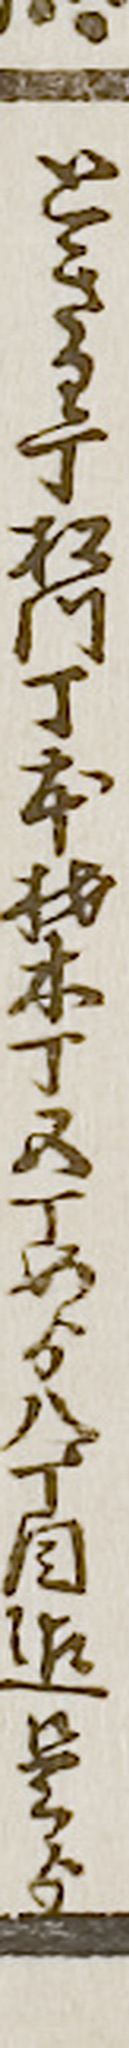ときわ丁松川丁本材木丁五丁めより八丁目まで是より
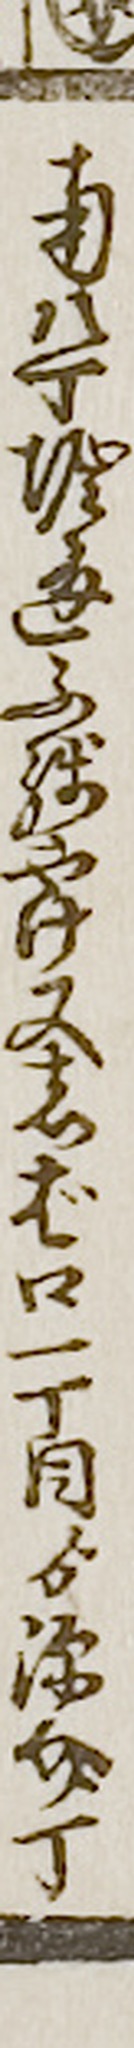南八丁堀通不残やけ又しば口一丁目より源介丁
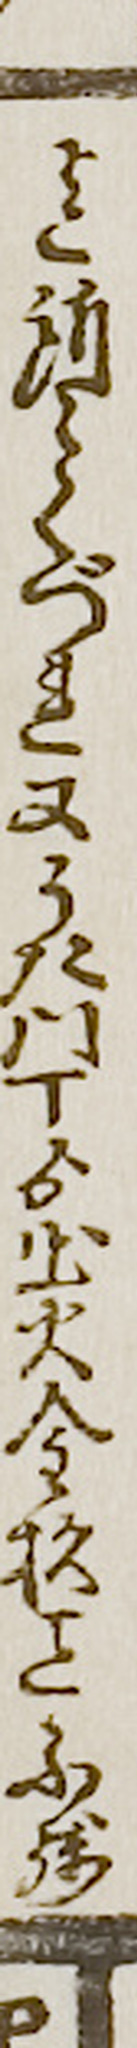迄所々くづれ又うた川丁より出火金杉迄不残
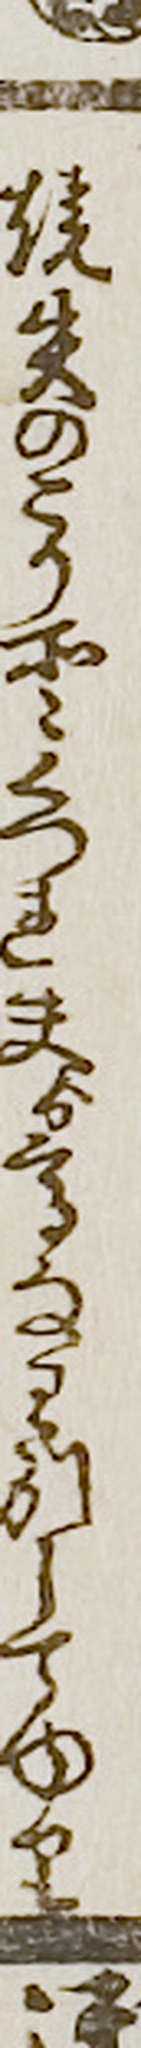焼失のこり所々くつれ夫より高なわ別してゆり
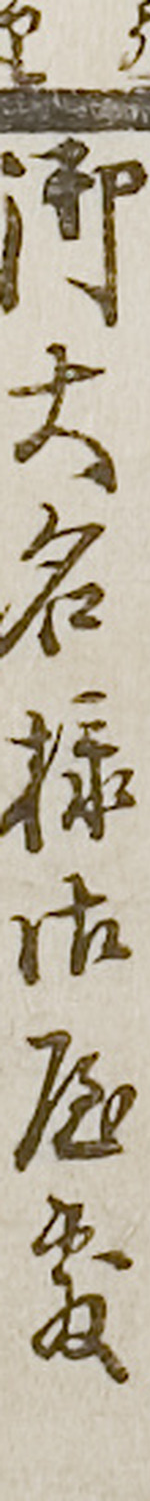御大名様御屋敷
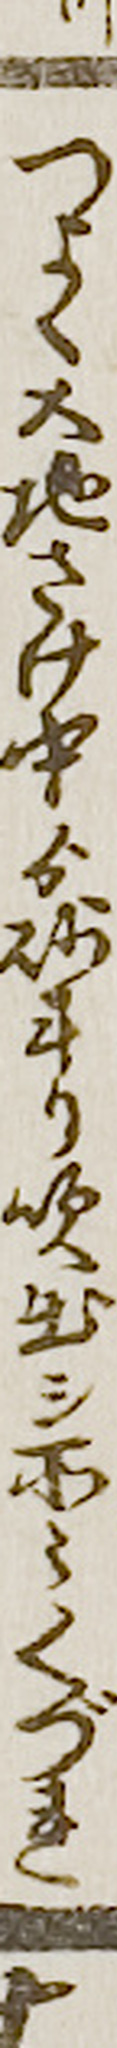つよく大地さけ中より砂斗り吹出シ所々くづれ
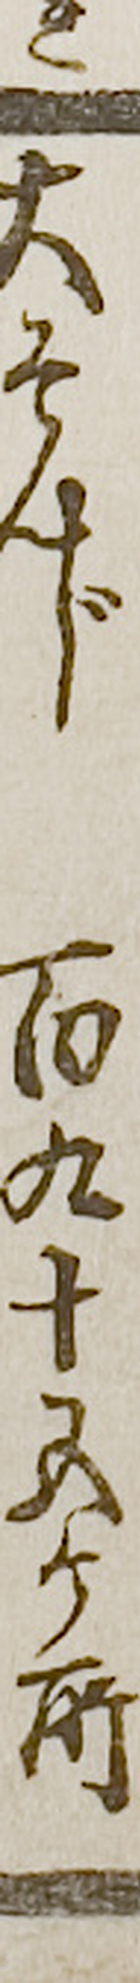大そんじ百九十五ケ所
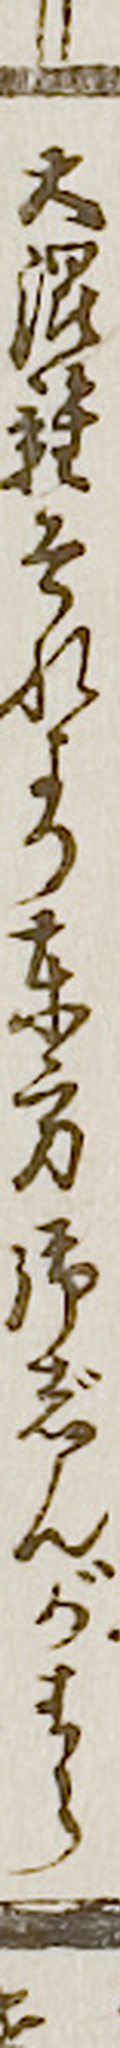大混雑それより東方御じんがはら
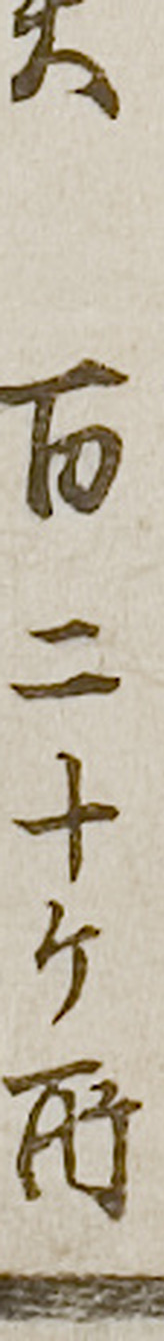焼失百二十ケ所
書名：安政二乙卯歳十月二日夜ル四ツ時震始メ末代
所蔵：東京大学総合図書館 General Library in the University of Tokyo, JAPAN
